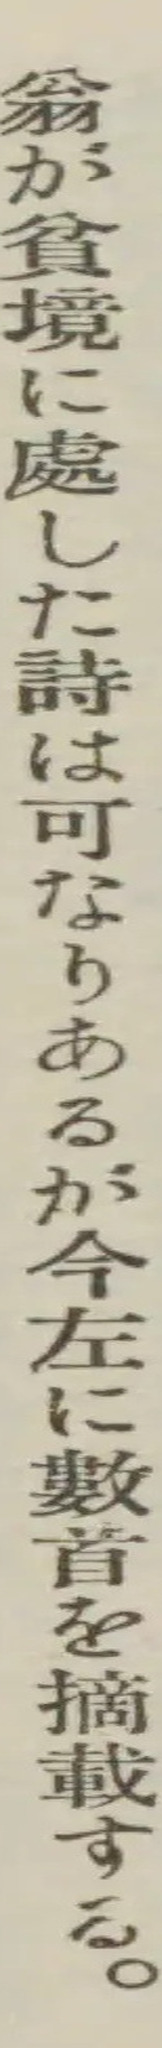翁が貧境に処した詩は可なりあるが今左に数首を摘載する。
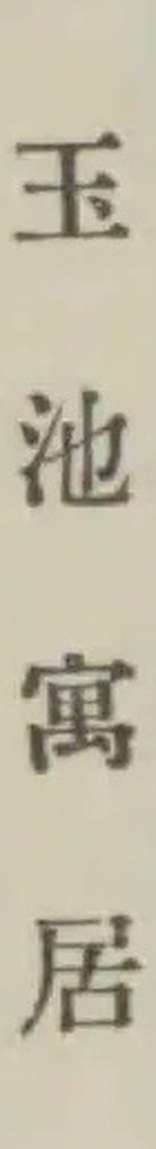玉池寓居
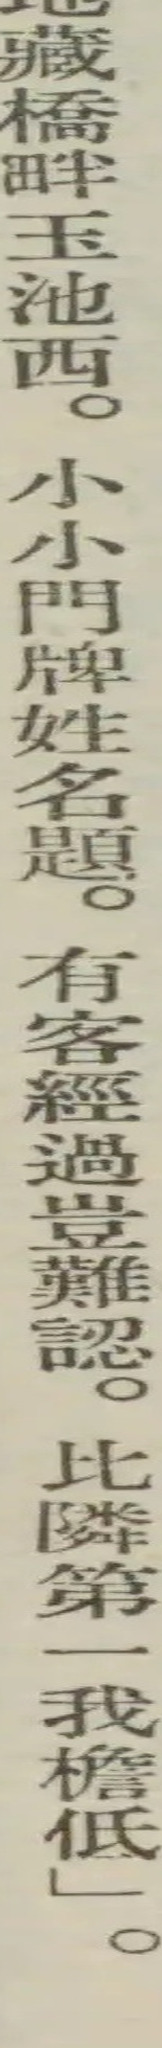地蔵橋畔玉池西。小小門牌姓名題。有客経過豈難認。比隣第一我檐低」。
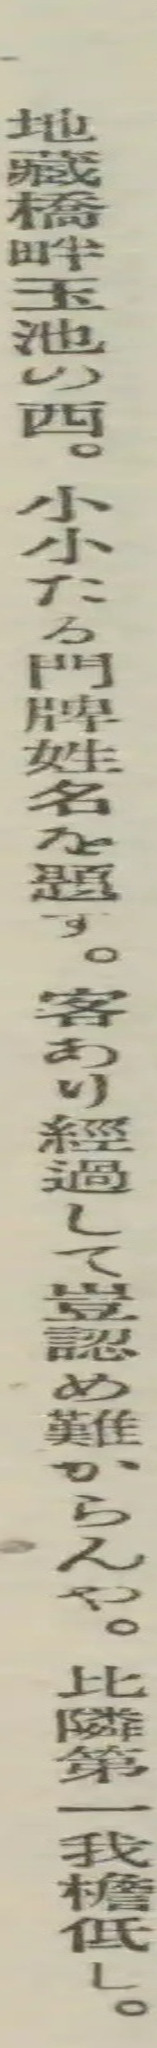地蔵橋畔玉池の西。小小たる門牌姓名を題す。客あり経過して豈認め難からんや。比隣第一我檐低し。
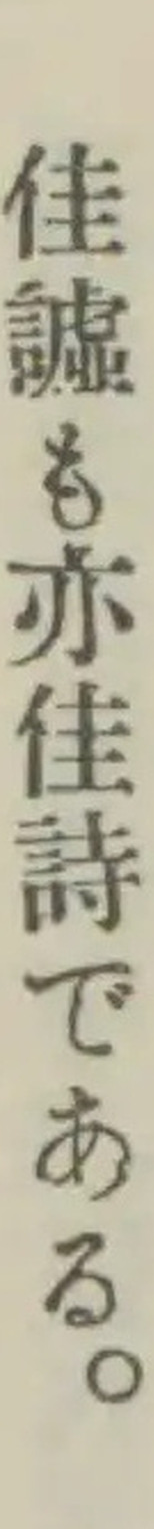佳譃も亦佳詩である。
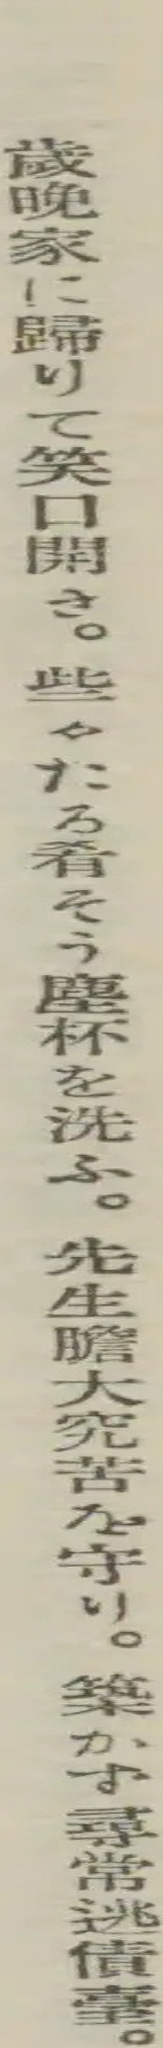歳晩家に帰りて笑口開き。些々たる肴そう塵杯を洗ふ。先生胆大究苦を守り。築かず尋常逃債台。
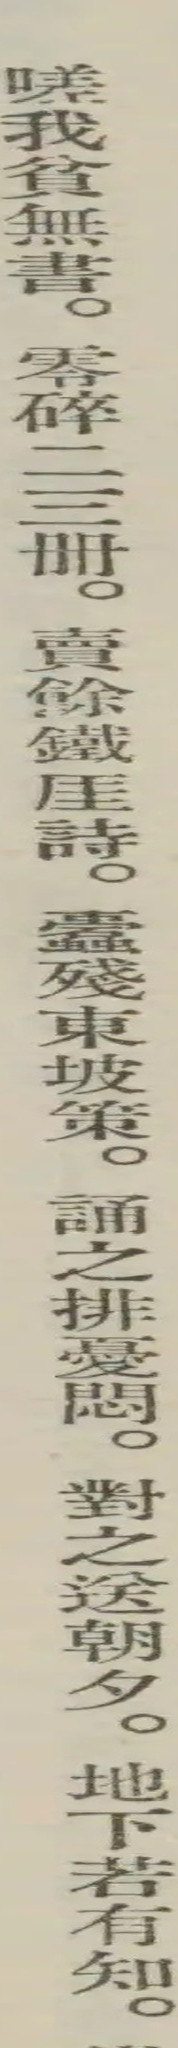嗟我貧無書。零砕二三冊。売余鉄厓詩。蠹残東坡策。誦之排憂悶。対之送朝夕。地下若有知。豈謂
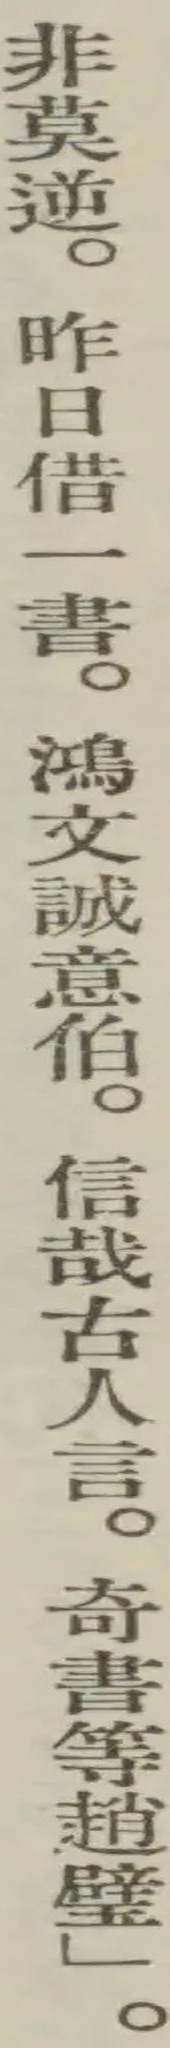非莫逆。昨日借一書。鴻文誠意伯。信哉古人言。奇書等趙壁」。
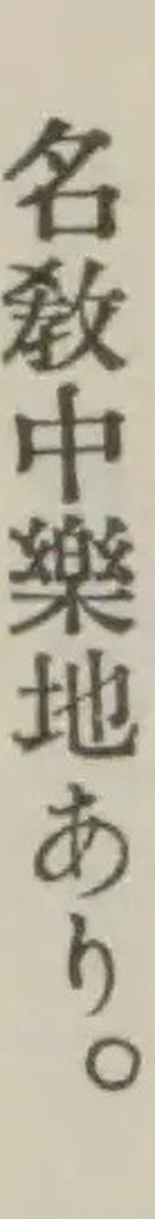名教中楽地あり。
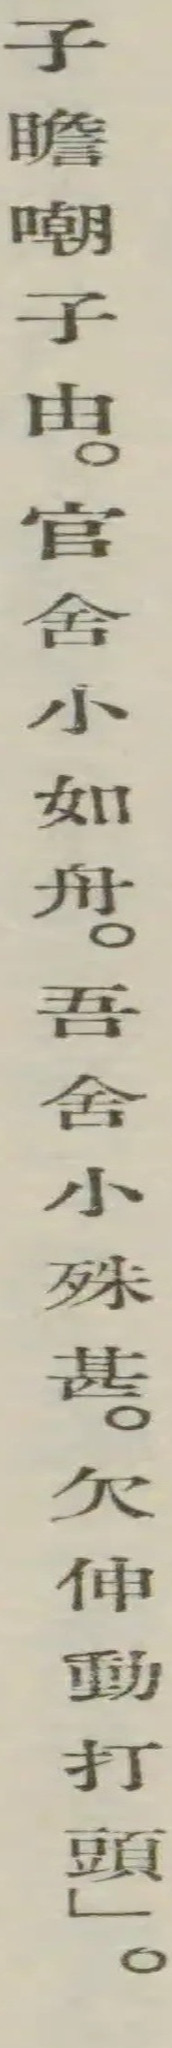子瞻嘲子由。官舎小如舟。吾舎小殊甚。欠伸動打頭」。
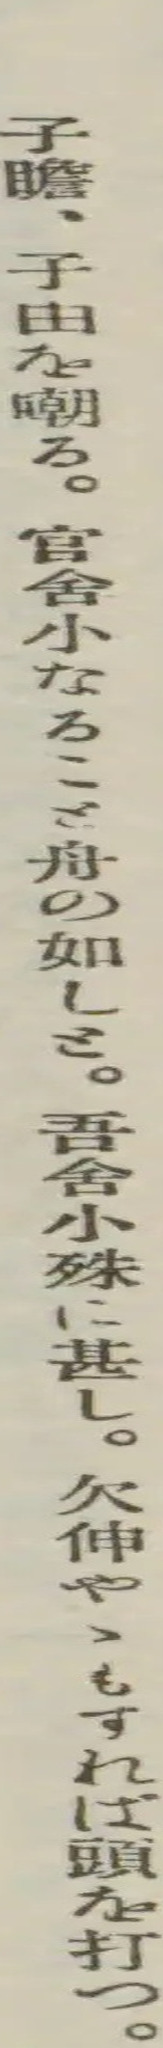子瞻、子由を嘲る。官舎小なること舟の如しと。吾舎小殊に甚し。欠伸やゝもすれば頭を打つ。
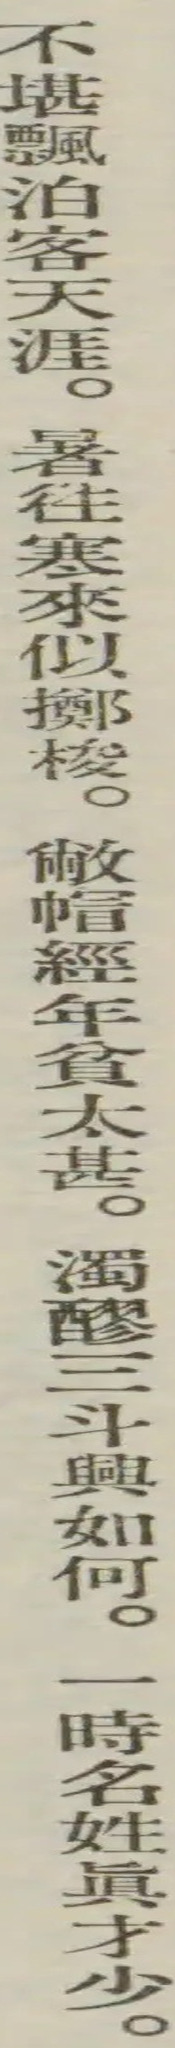不堪飄泊客天涯。暑往寒来似擲梭。敝帽経年貧太甚。濁醪三斗興如何。一時名姓真才少。
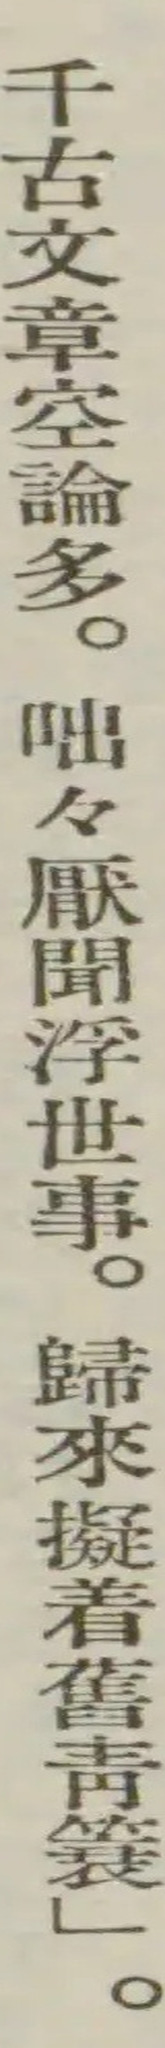千古文章空論多。咄々厭聞浮世事。帰来擬着旧青蓑」。
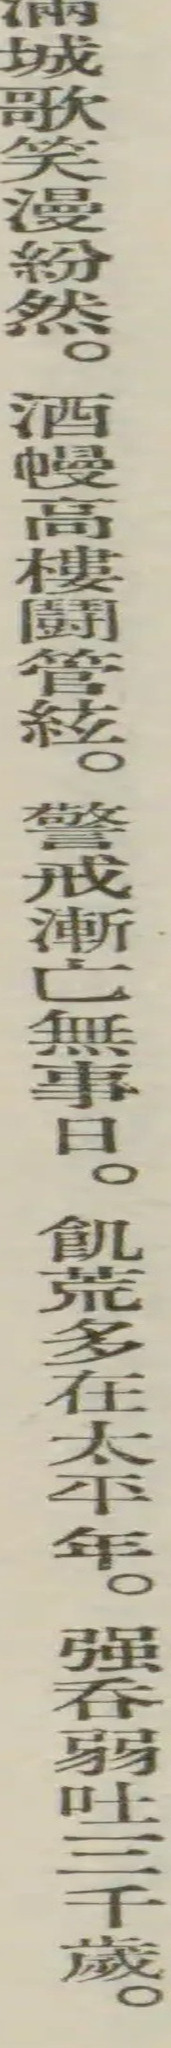満城歌笑漫紛然。酒幔高楼闘管絃。警戒漸亡無事日。飢荒多在太平年。強呑弱吐三千歳。
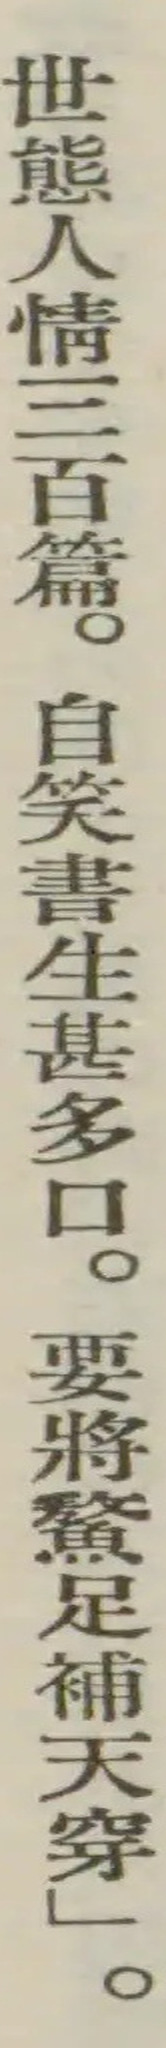世態人情三百篇。自笑書生甚多口。要将鼇足補天穿」。
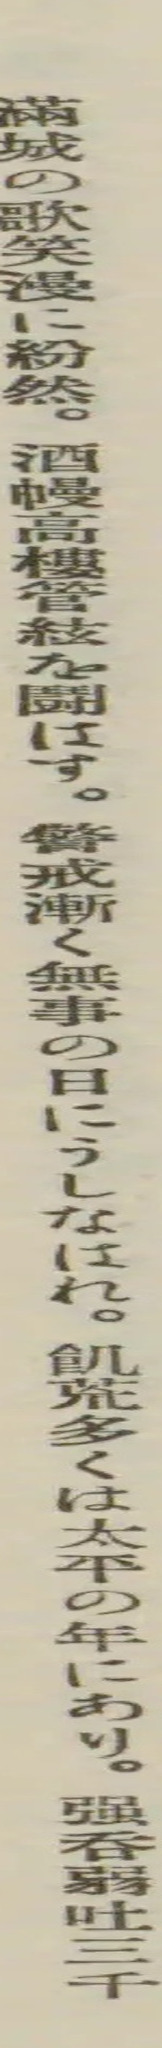満城の歌笑漫に紛然。酒幔高楼管絃を闘はす。警戒漸く無事の日にうしなはれ。飢荒多くは太平の年にあり。強呑弱吐三千
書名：小野湖山翁小伝
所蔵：国立国会図書館 National Diet Library, JAPAN
